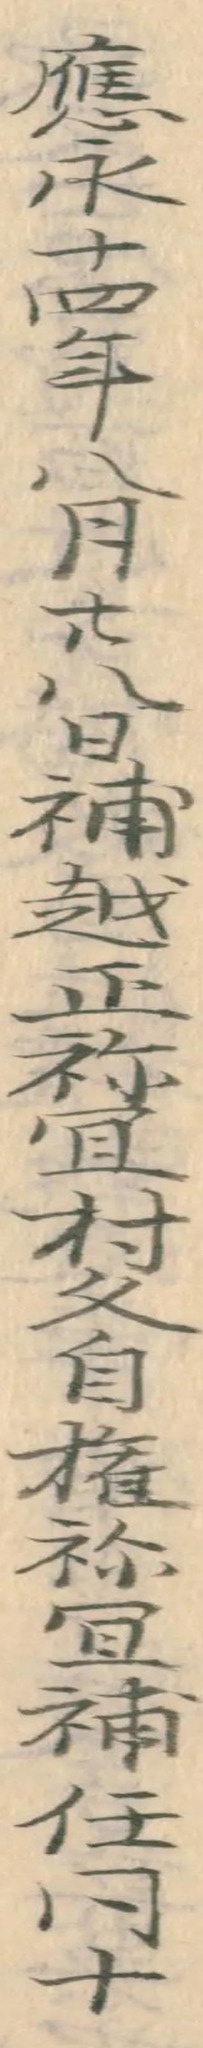応永十四年八月廿八日補越正祢宜村久自権祢宜補任同十
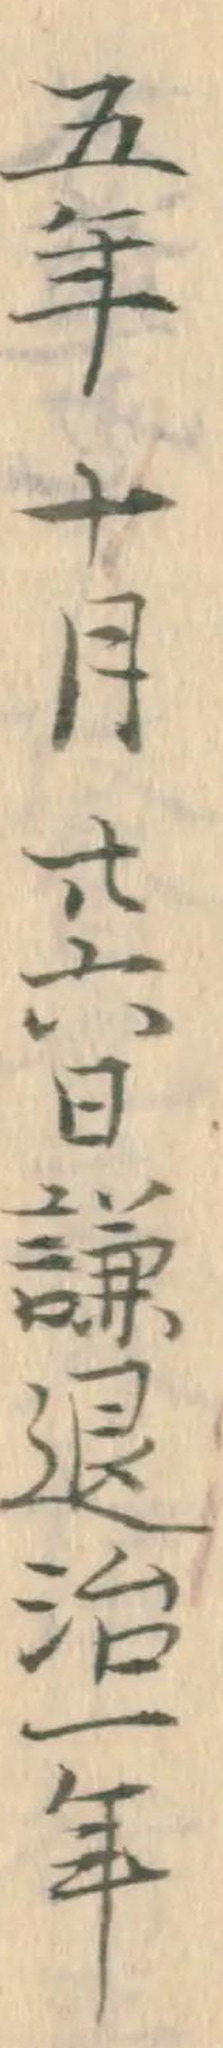五年十月廿六日謙退治一年
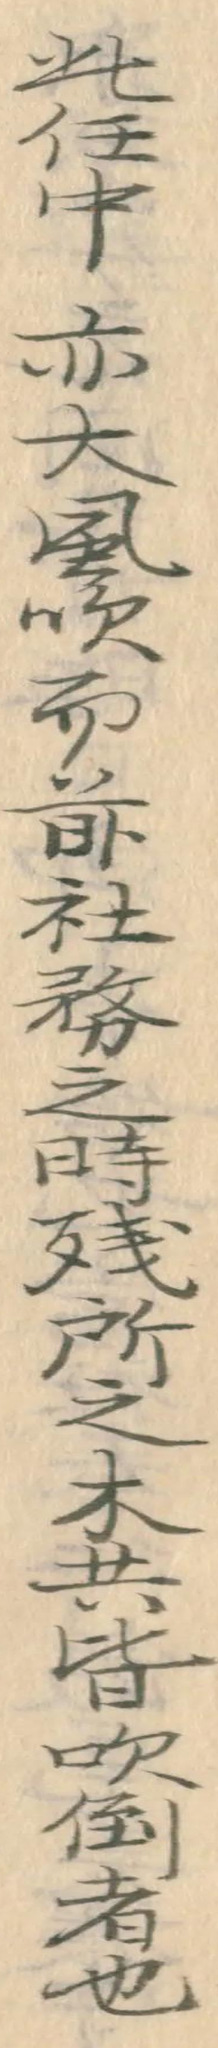此任中亦大風吹而前社務之時残所之木共皆吹倒者也
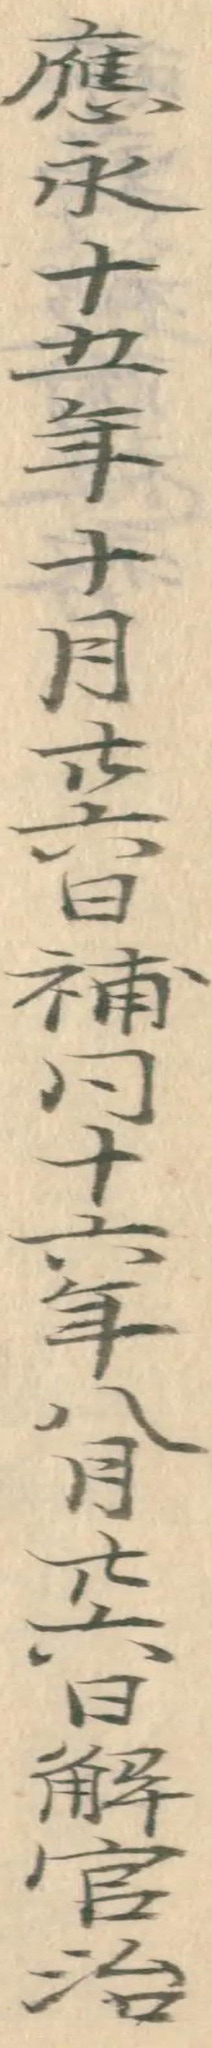応永十五年十月廿六日補同十六年八月廿六日解官治
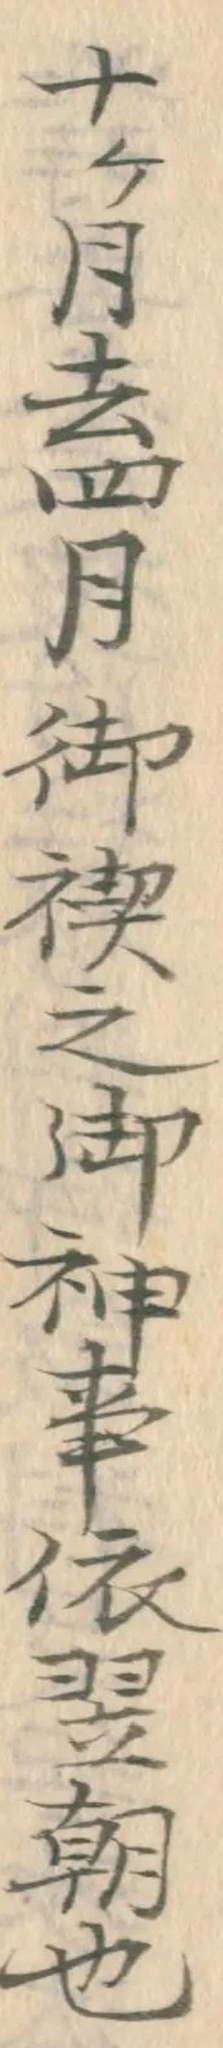十ケ月去四月御禊之御神事依翌朝也
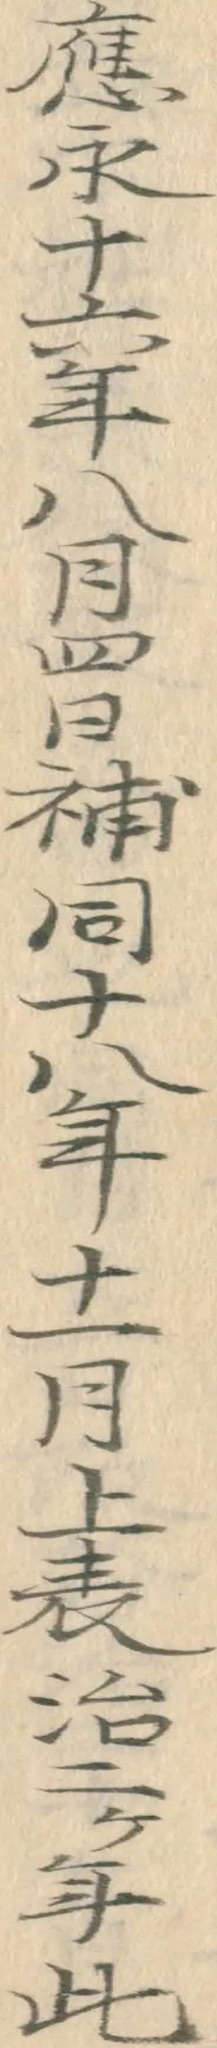応永十六年八月四日補同十八年十一月上表治二ケ年此
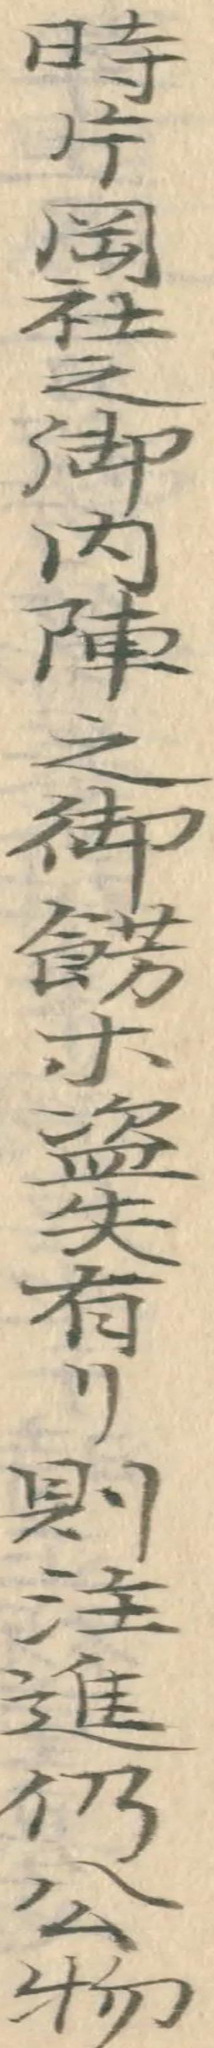時片岡社之御内陣之御錺等盗失有リ則注進仍公物
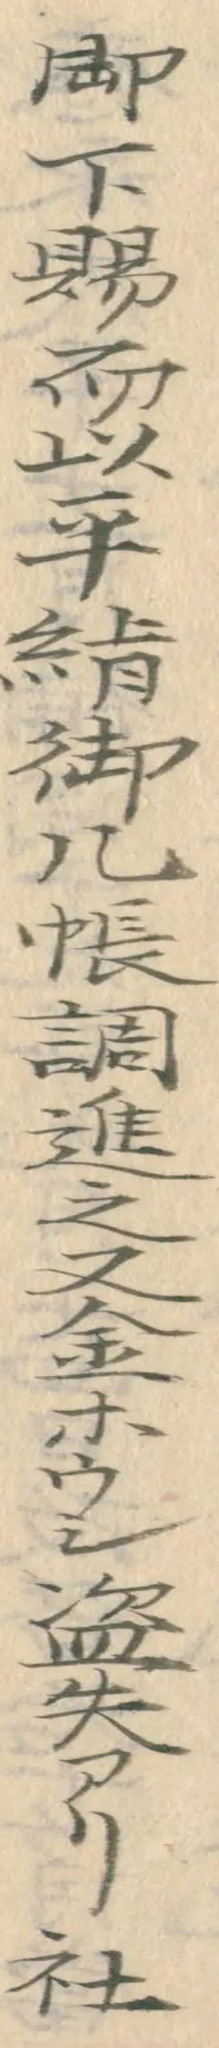御下賜而以平絹御几帳調進之又金ホウシ盗失アリ社
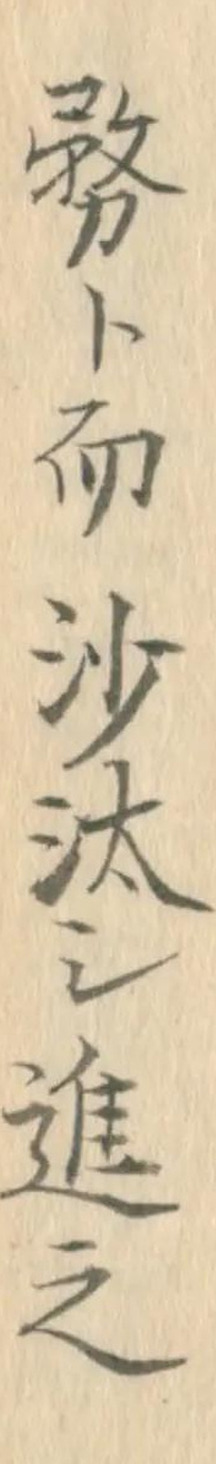務ト而沙汰シ進之

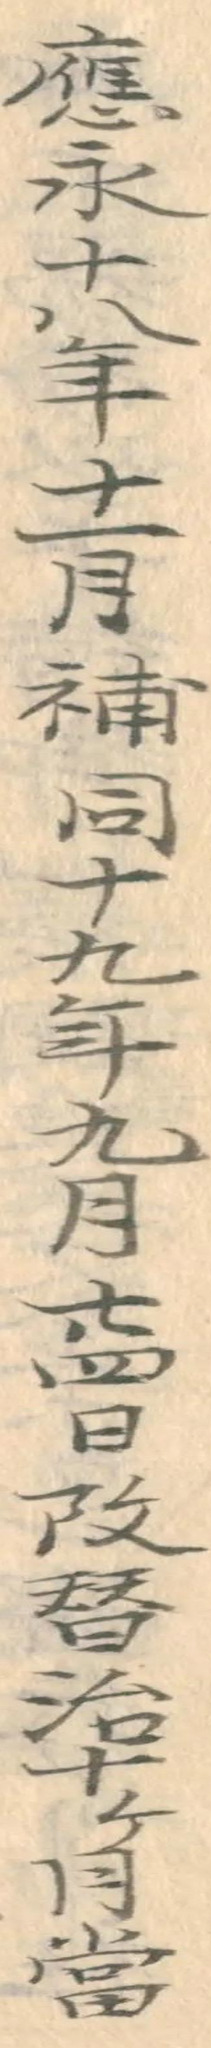応永十八年十一月補同十九年九月廿四日改替治十ケ月当
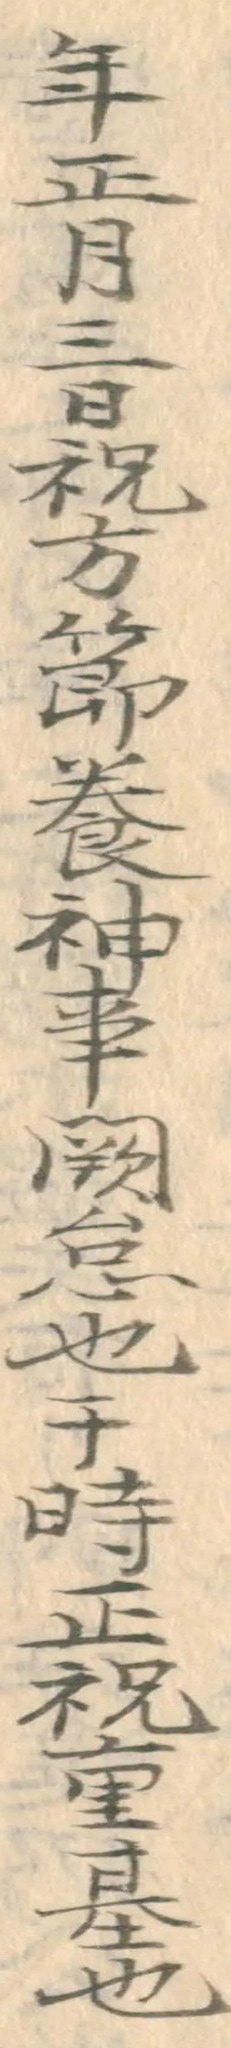年正月三日祝方節養神事闕怠也于時正祝重基也
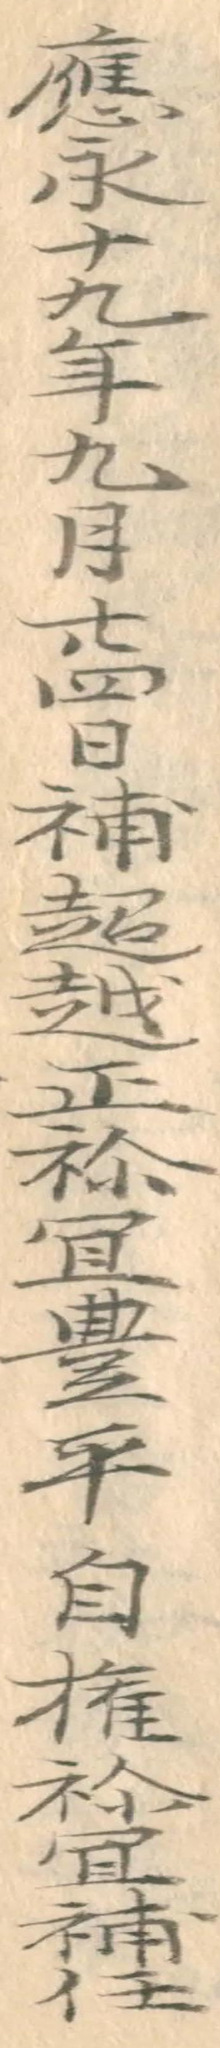応永十九年九月廿四日補超越正祢宜豊平自権祢宜補任
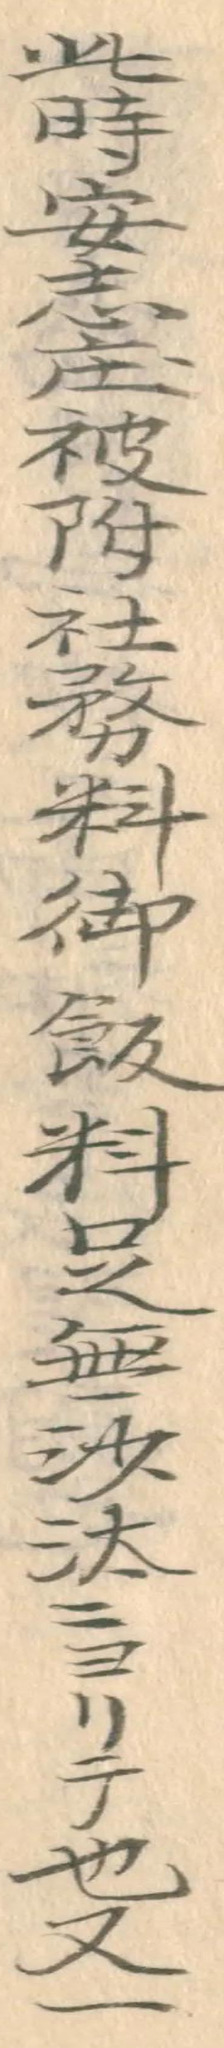此時安志庄被附社務料御飯料足無沙汰ニヨリテ也又一
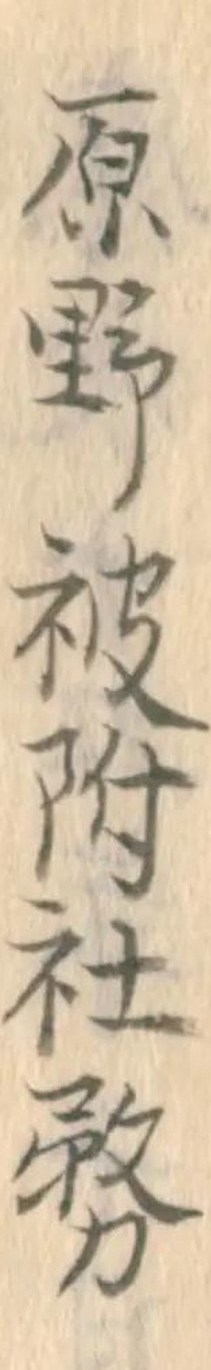原野被附社務
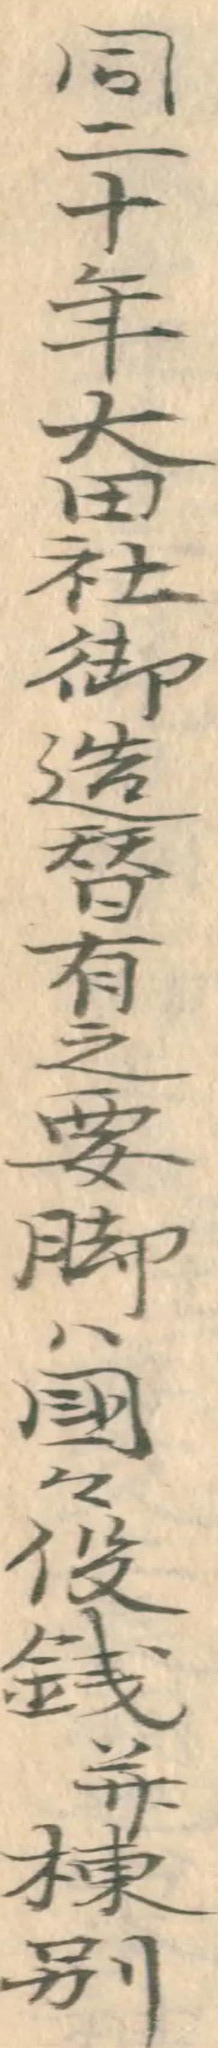同二十年大田社御造替有之要脚ハ国々役銭并棟別
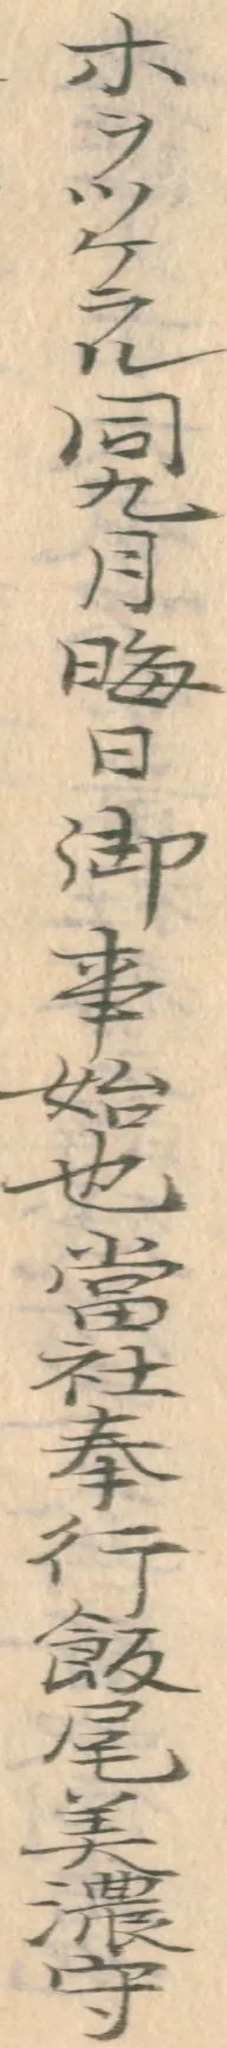等ヲツケラル同九月晦日御事始也当社奉行飯尾美濃守
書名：賀茂社記録. 第24冊
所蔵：国立国会図書館 National Diet Library, JAPAN
